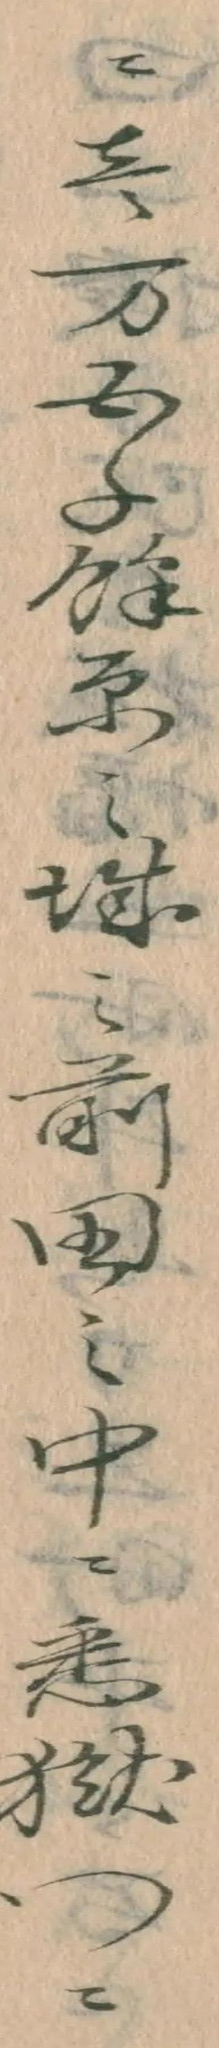に壱万五千余原之城之前田之中に悉獄門に
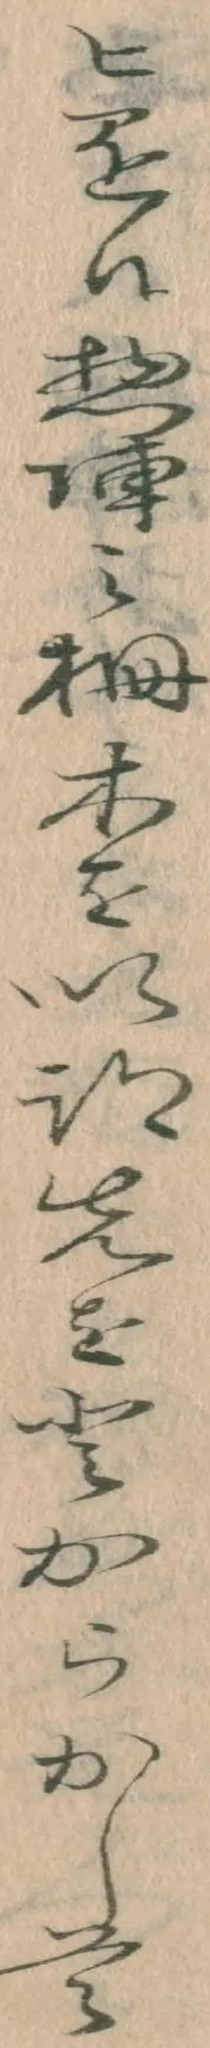被懸候惣陣之柵木を以跡先を登からかし首
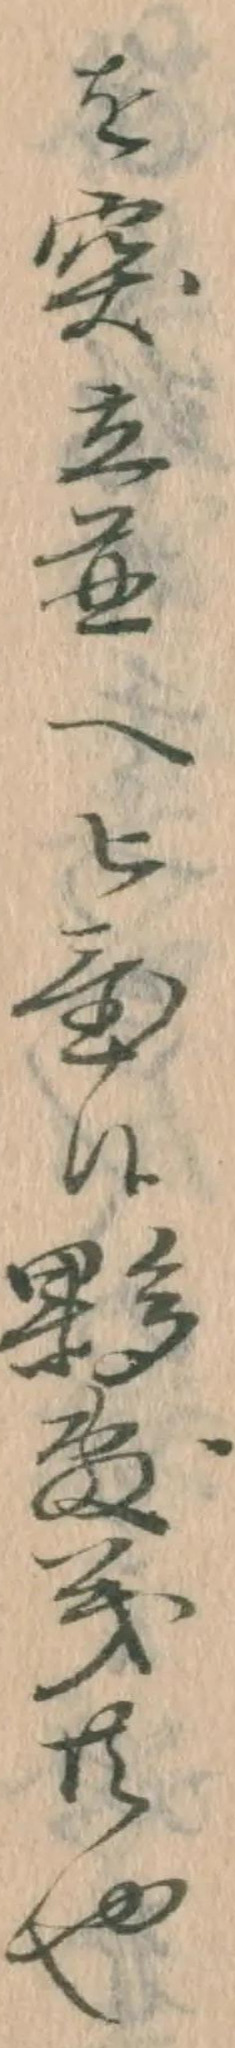を突立並へ被置候夥敷義共也
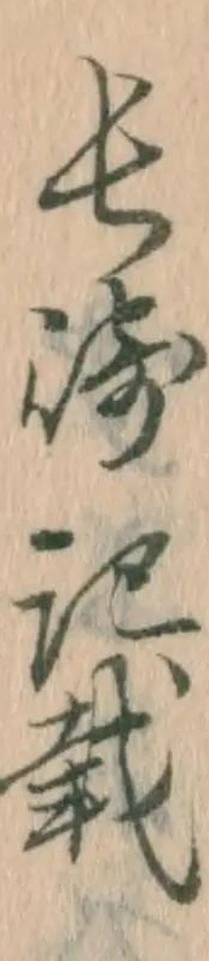長崎記載
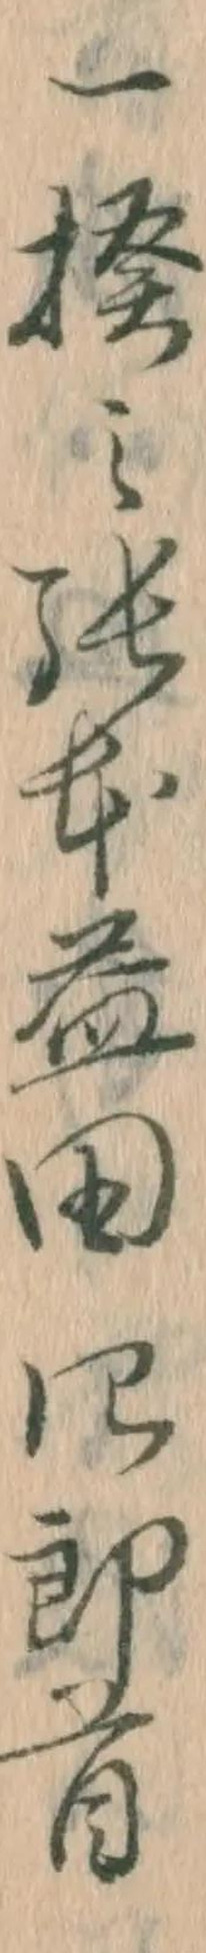一揆之張本益田四郎首
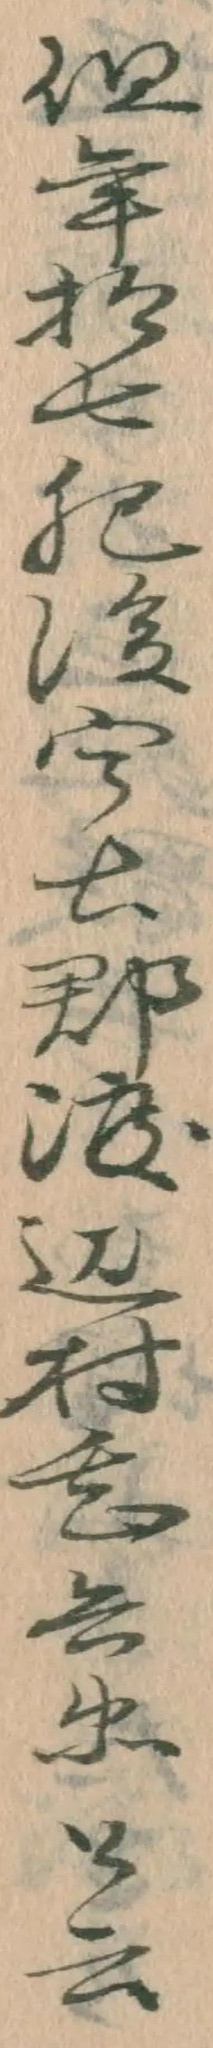但年拾七肥後宇土郡渡辺村甚兵衛と云
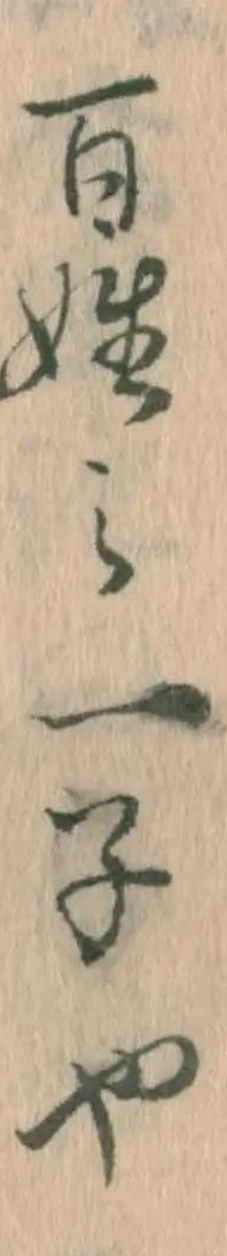百姓之一子也
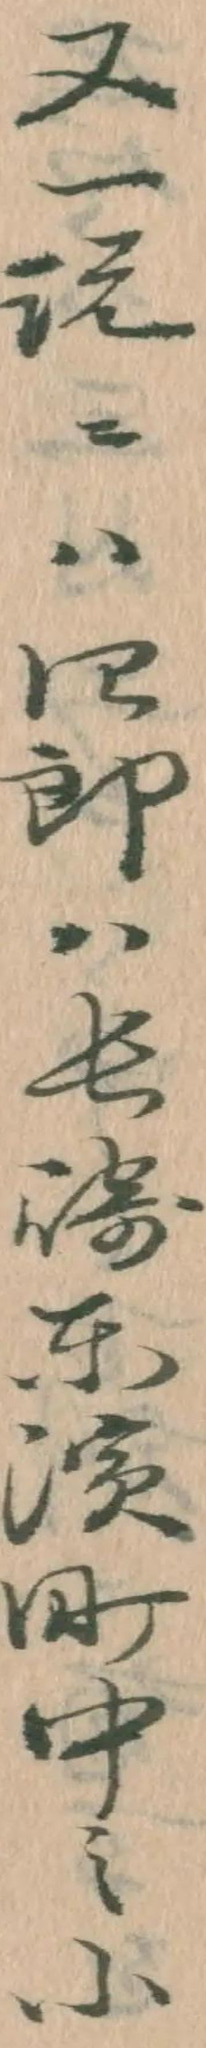又一説には四郎は長崎東浜長中之小
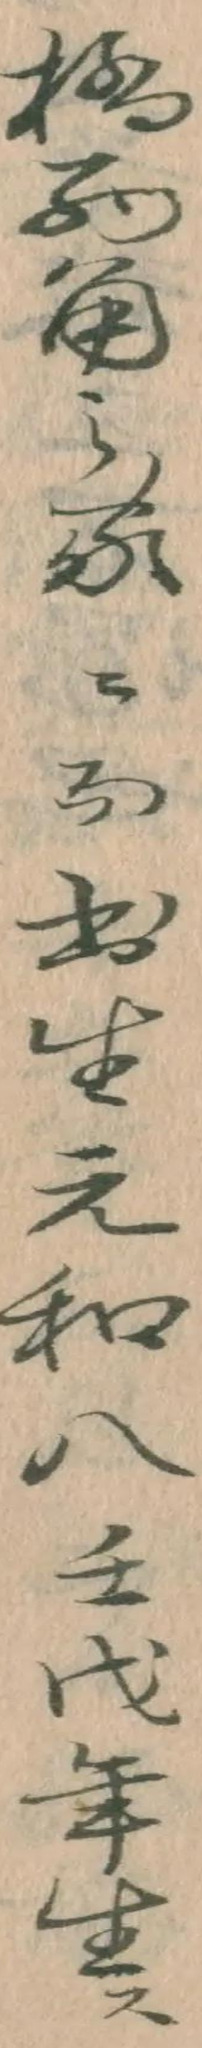橋西角之家に而出生元和八壬戌年生す
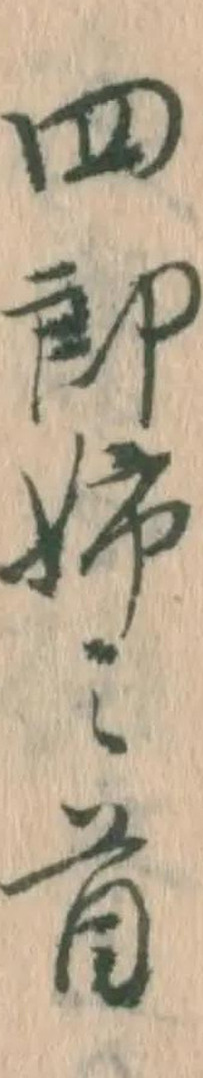四郎姉之首
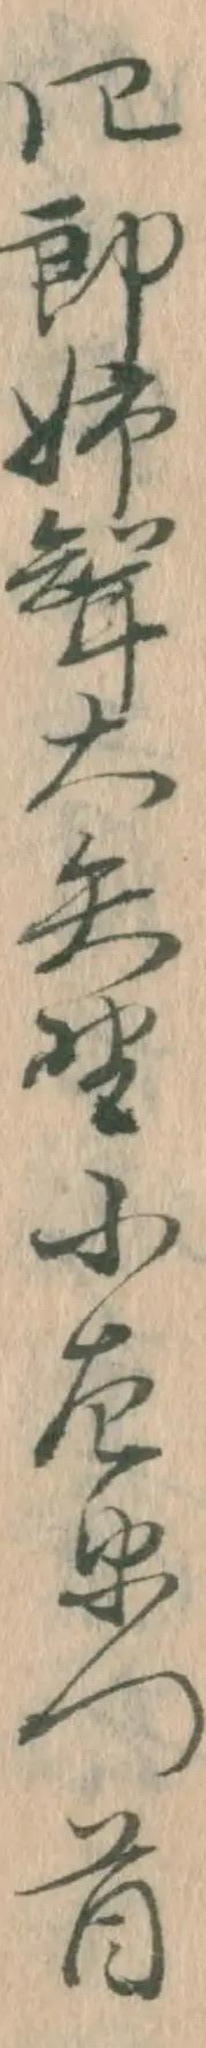四郎姉聟大矢野小左衛門首
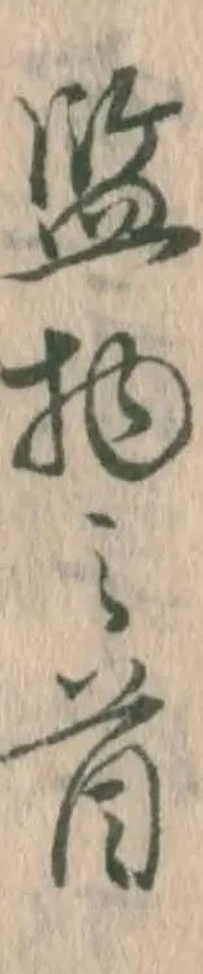監物之首
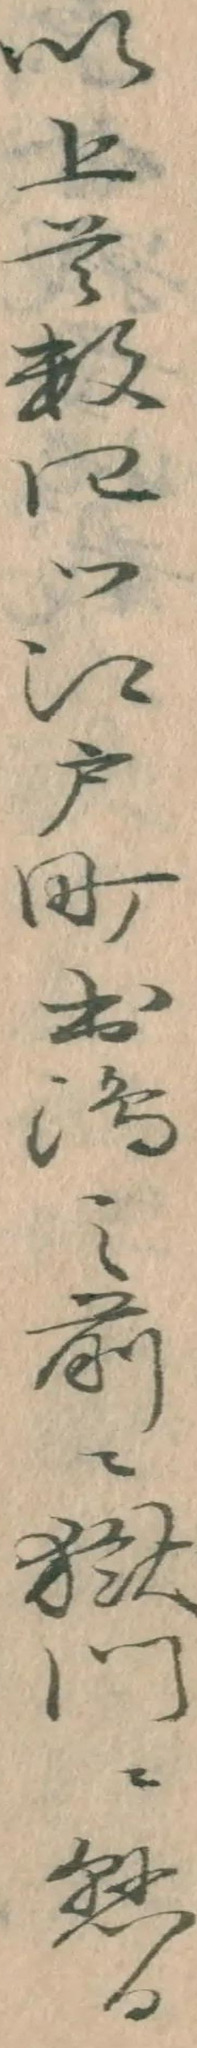以上首数四つ江戸長出島之前に獄門に懸る
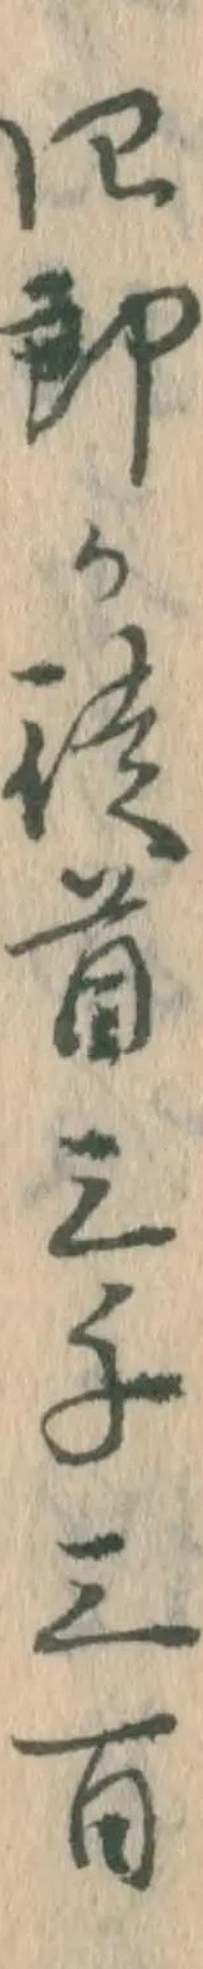四郎か徒首三千三百
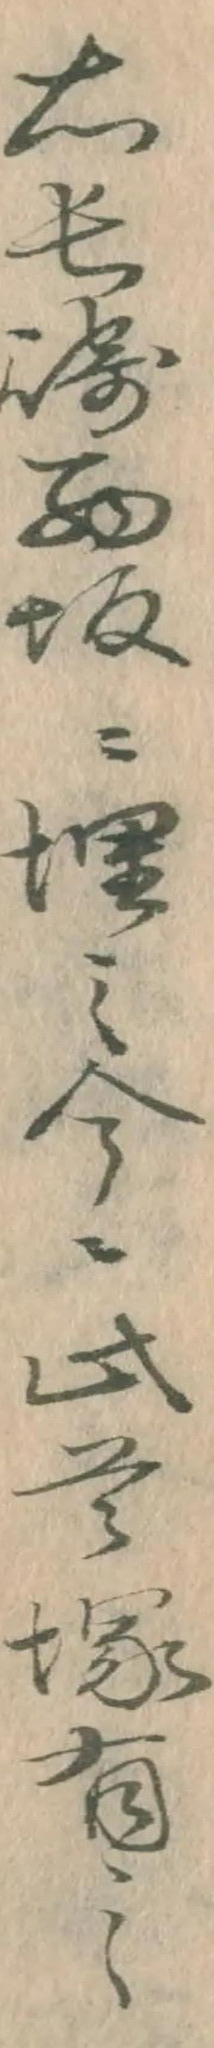右長崎西坂に埋之今に此首塚有之
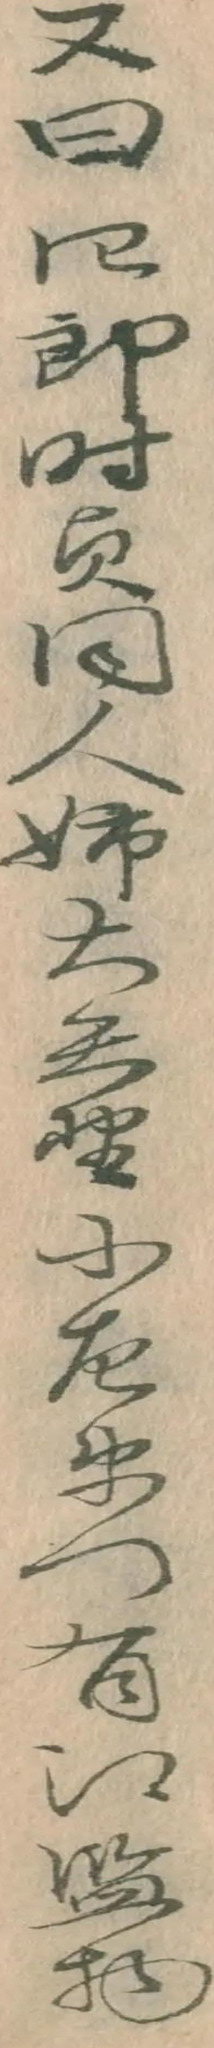又曰四郎時貞同人姉大矢野小左衛門有江監物
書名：切支丹御退治記 49巻. [9]
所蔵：国立国会図書館 National Diet Library, JAPAN
